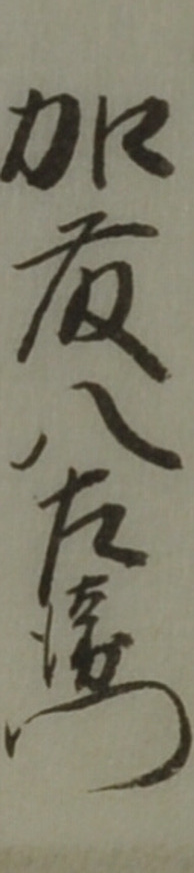加藤八左衛門
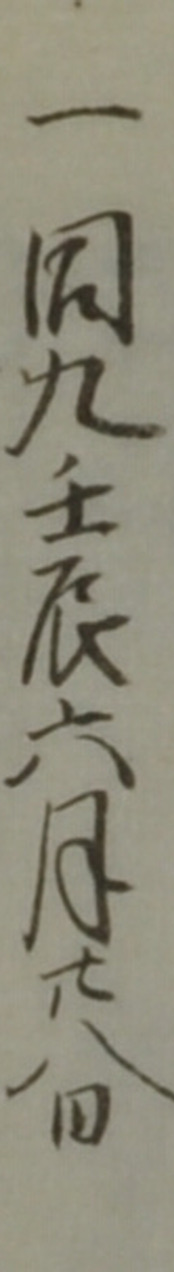一同九壬辰六月廿八日
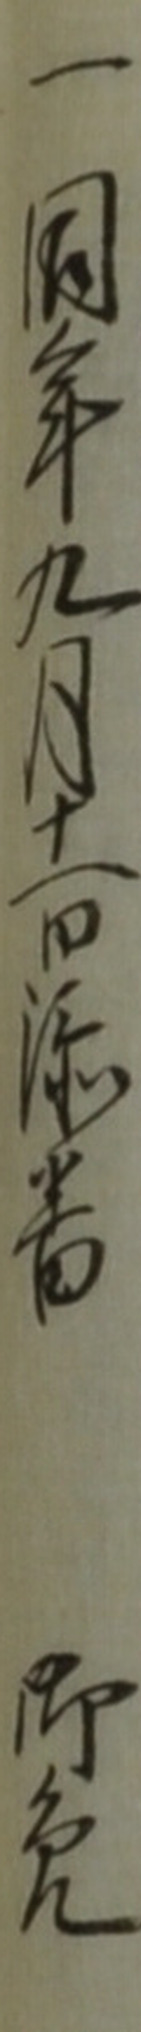一同年九月十一日添番御免
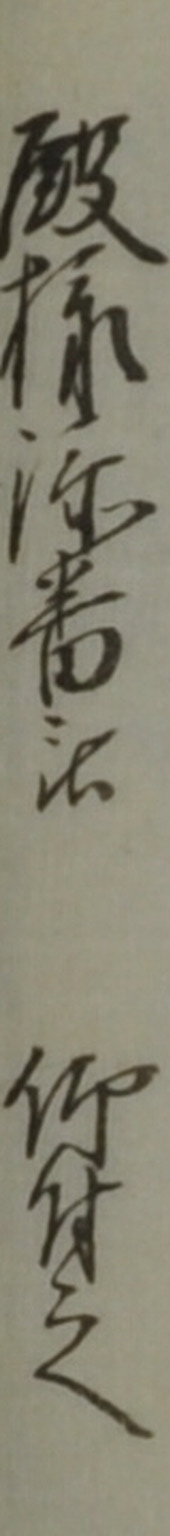殿様添番被仰付之
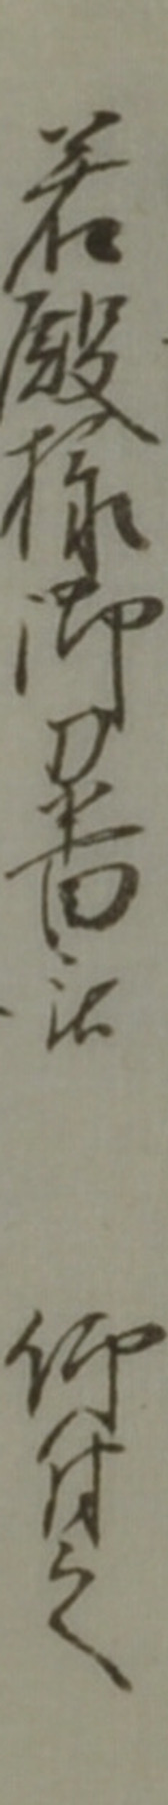若殿様御刀番被仰付之
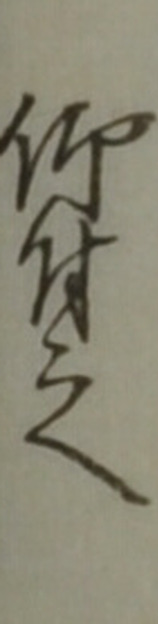仰付之
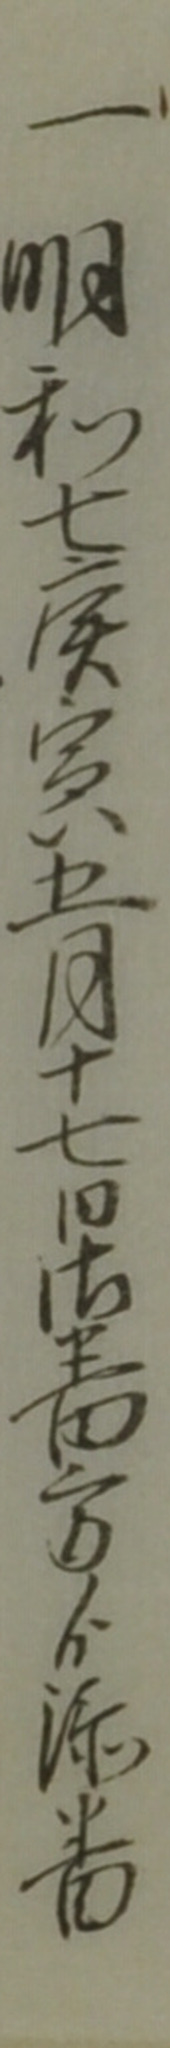一明和七庚寅五月十七日御番方より添番
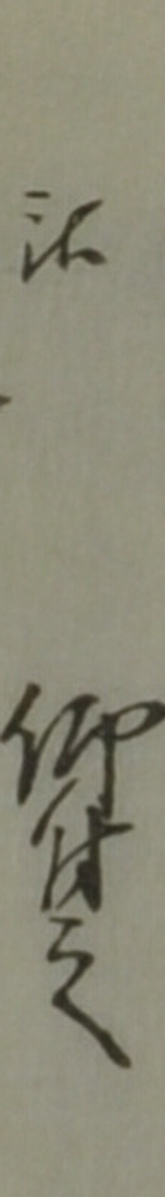被仰付之
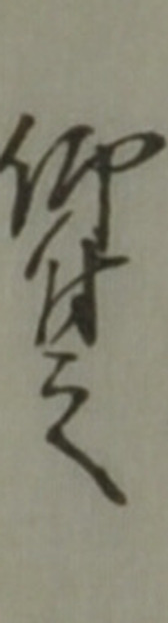仰付之
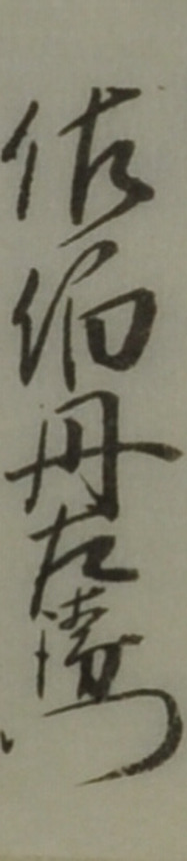佐伯丹左衛門
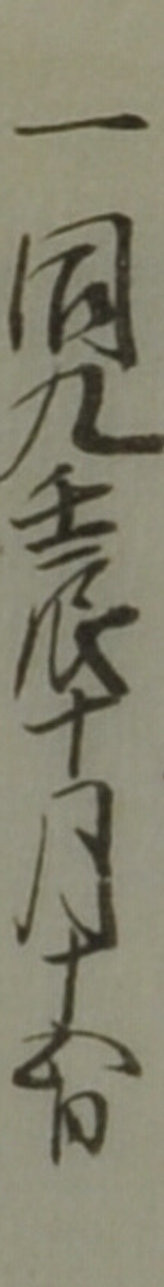一同九壬辰十月十五日
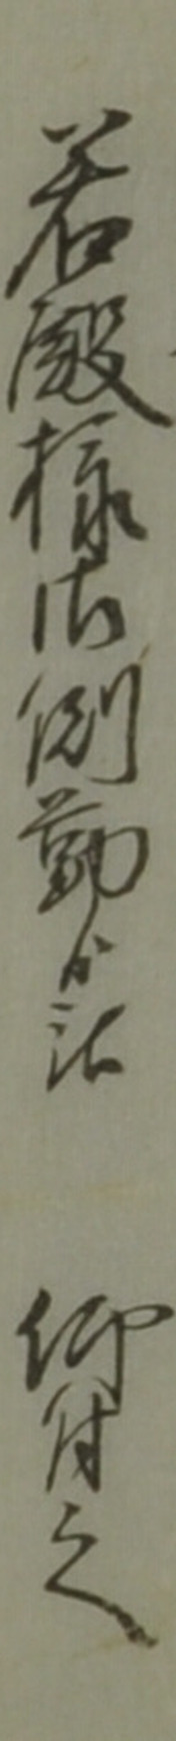若殿様御側勤より被仰付之
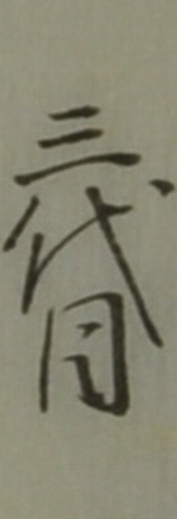三代目
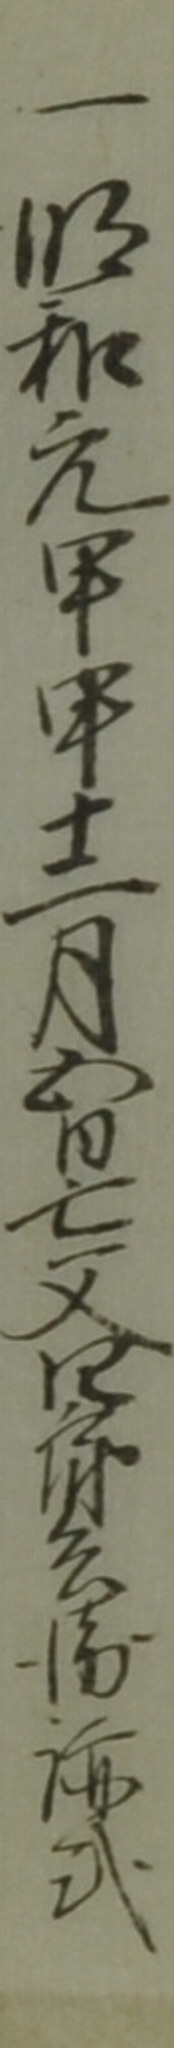一明和元甲申十二月五日亡父四郎兵衛跡式
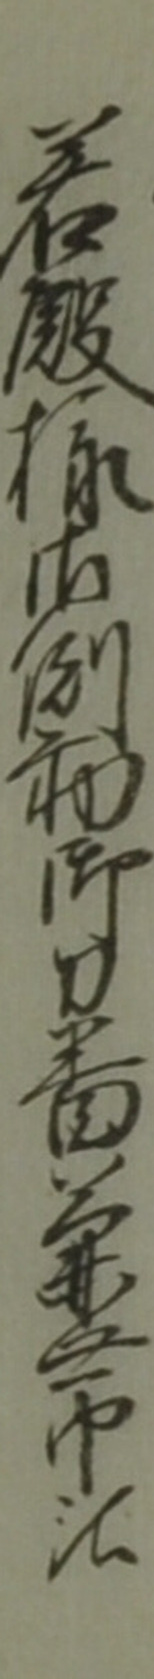若殿様御側勤御刀番兼帯被
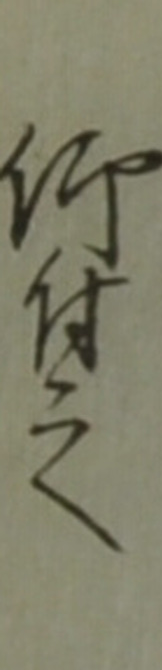仰付之
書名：諸御役代々録（八）
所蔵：伊那市立高遠町図書館・合同会社AMANE
